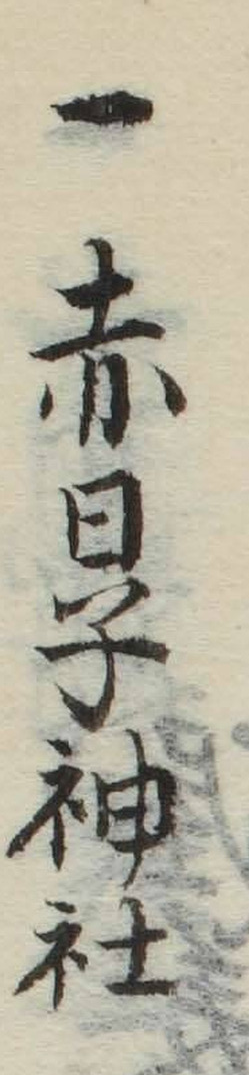一日長神社
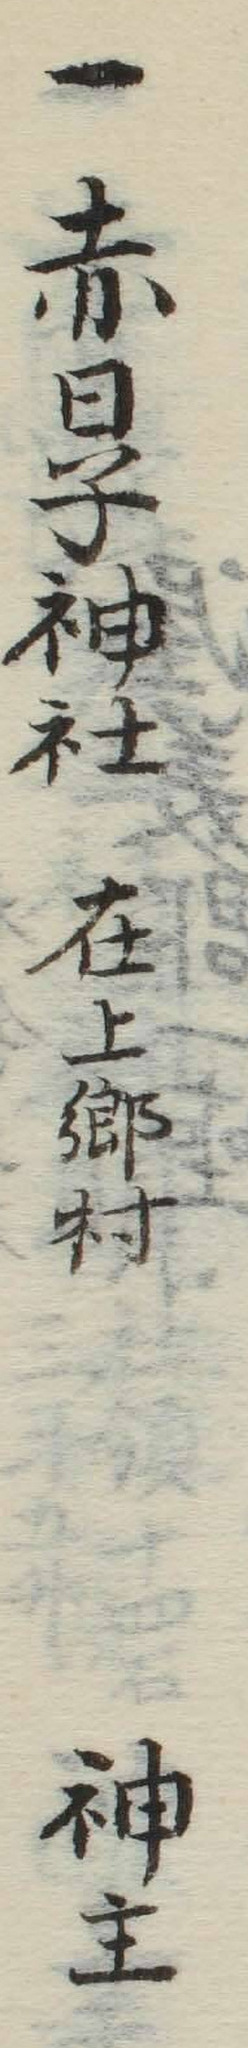一赤日子神社在上郷村神主
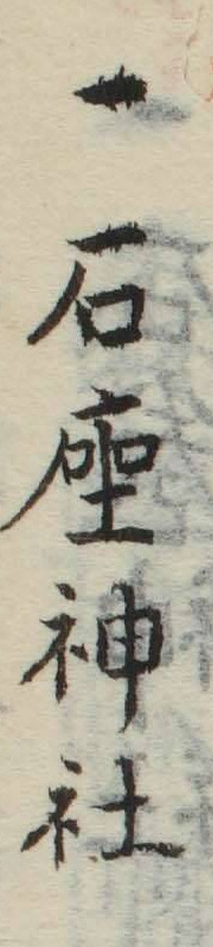一日長神社

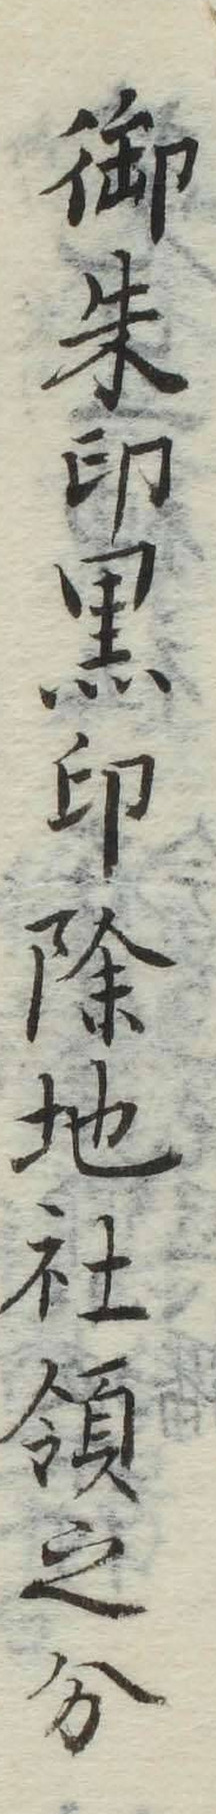御朱印黒印除地社領之分
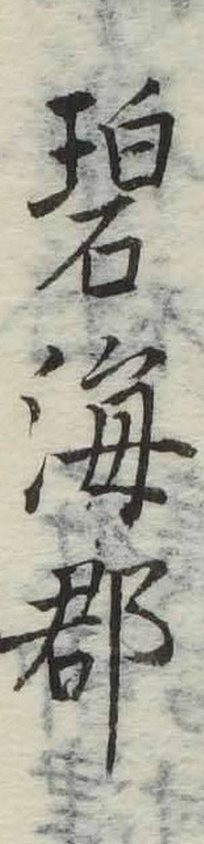碧海郡
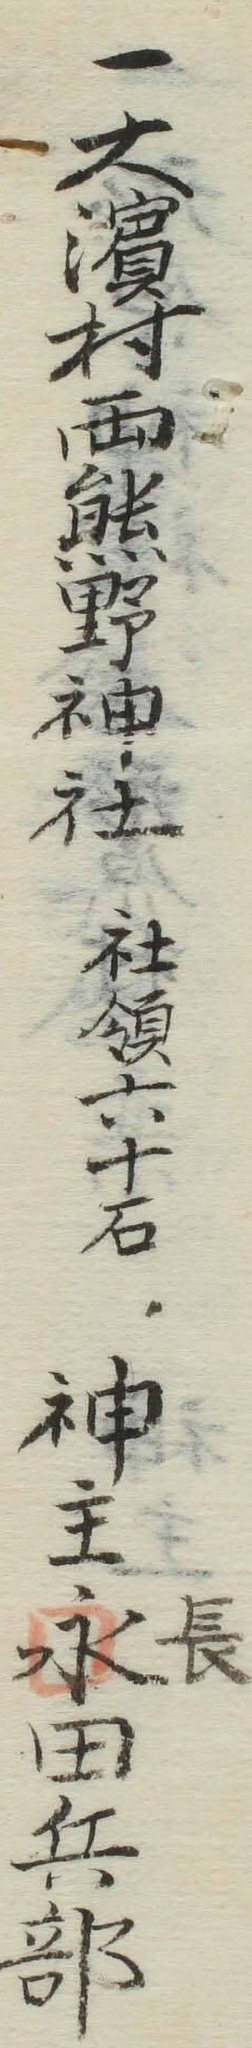一大浜村両熊野神社社領六十石神主長田兵部
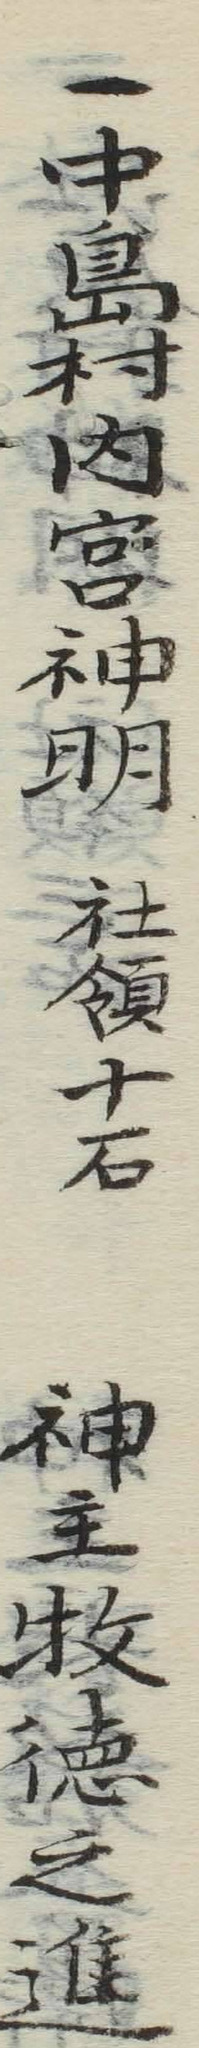一中島村内宮神明社領十石神主牧徳之進
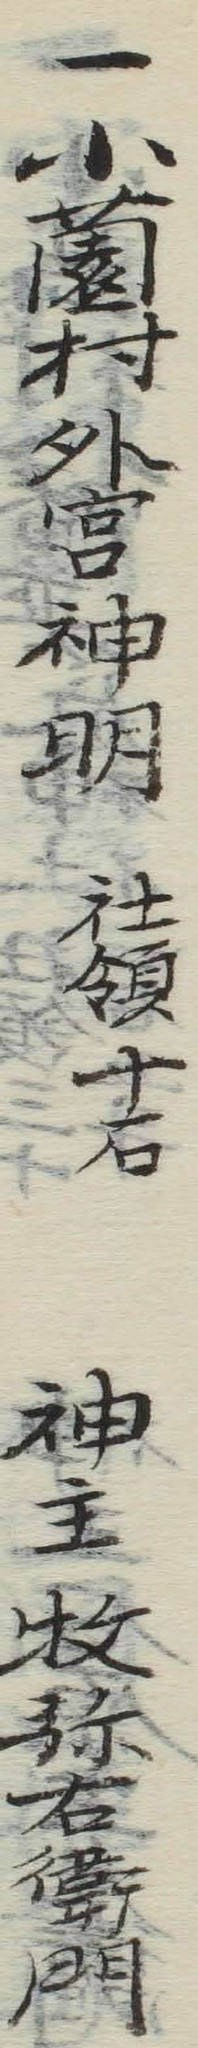一小園村外宮神明社領十石神主牧弥右衛門

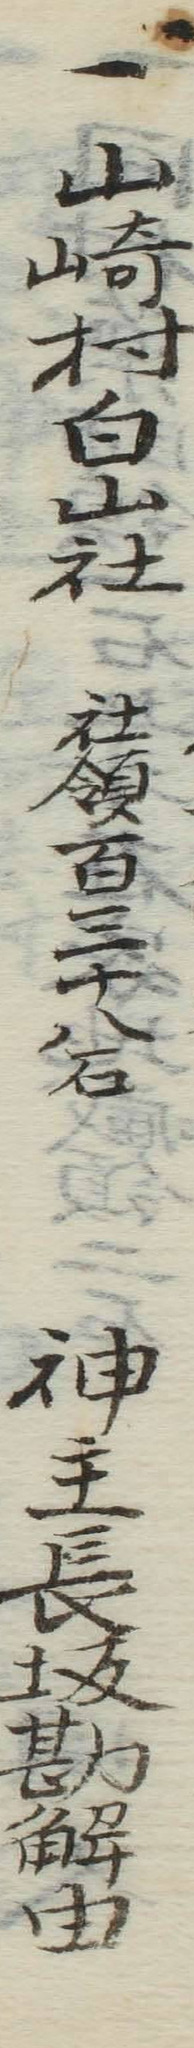一山崎村白山社社領百三十八石神主長坂勘解由
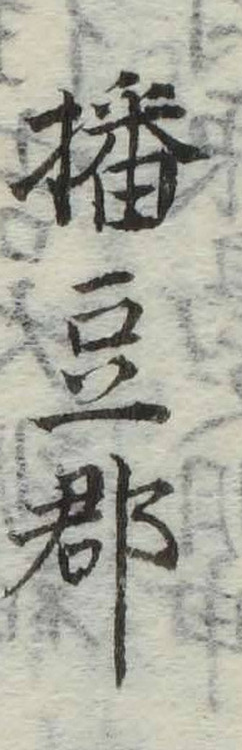播豆郡
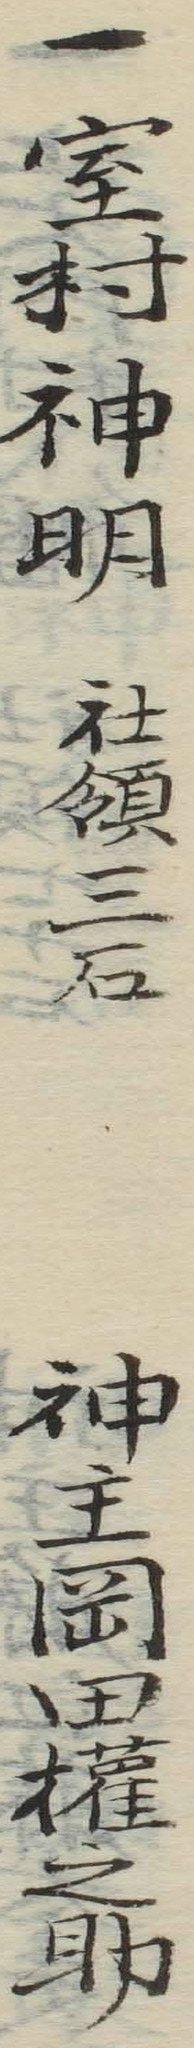一室村神明社領三石神主岡田権之助
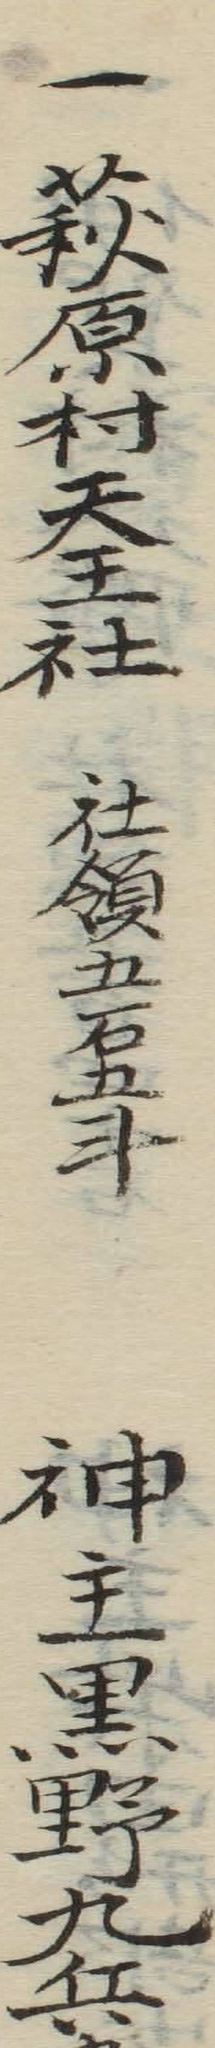一萩原村天王社社領五石五斗神主黒野九兵衛

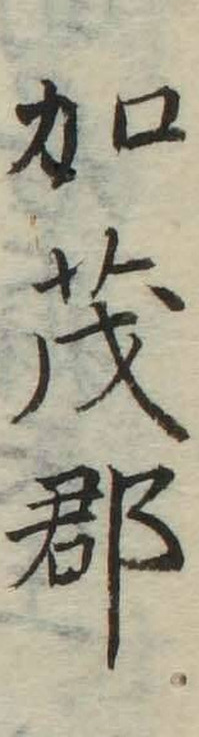加茂郡
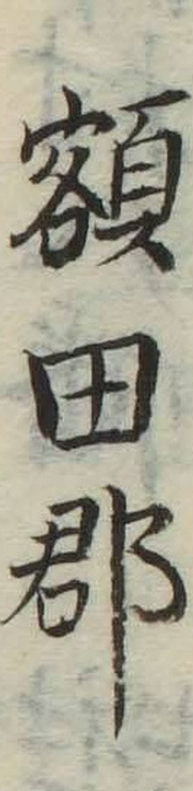額田郡
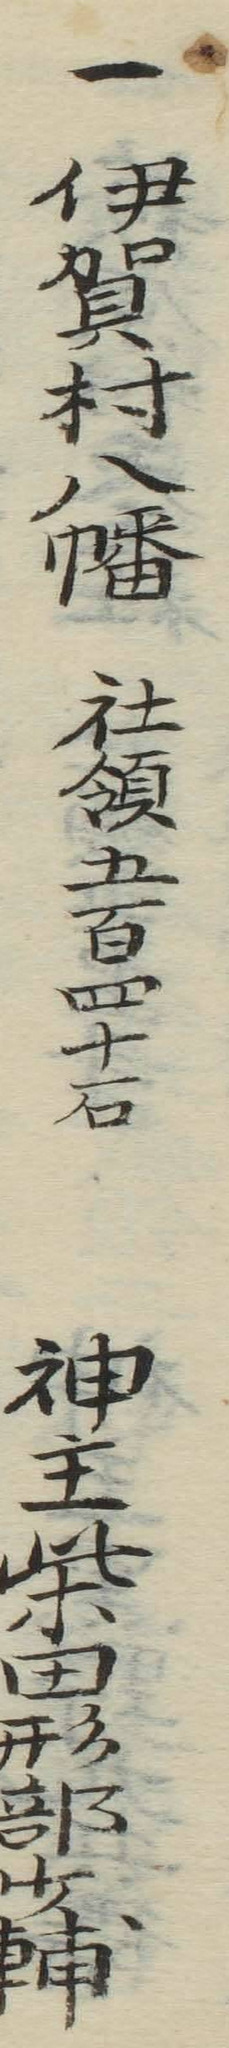一伊賀村八幡社領五百四十石神主柴田形部少輔
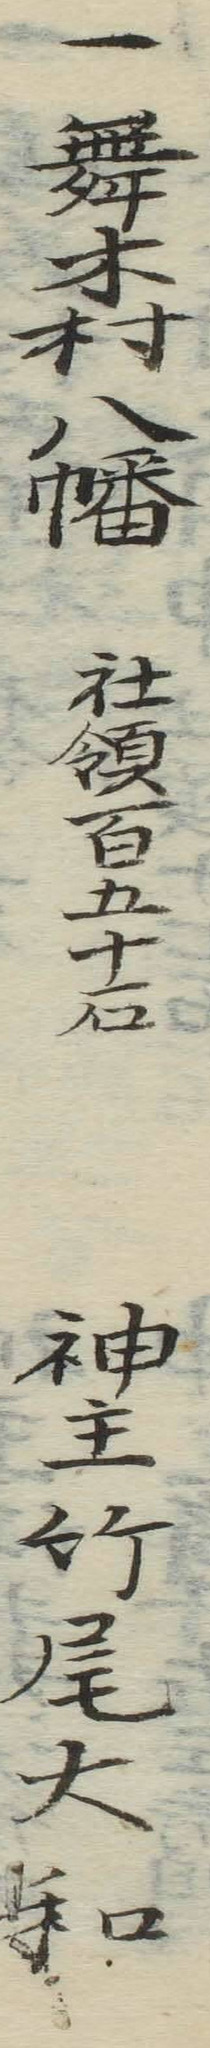一舞木村八幡社領百五十石神主竹尾大和
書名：三河国二葉松
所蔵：国文学研究資料館
